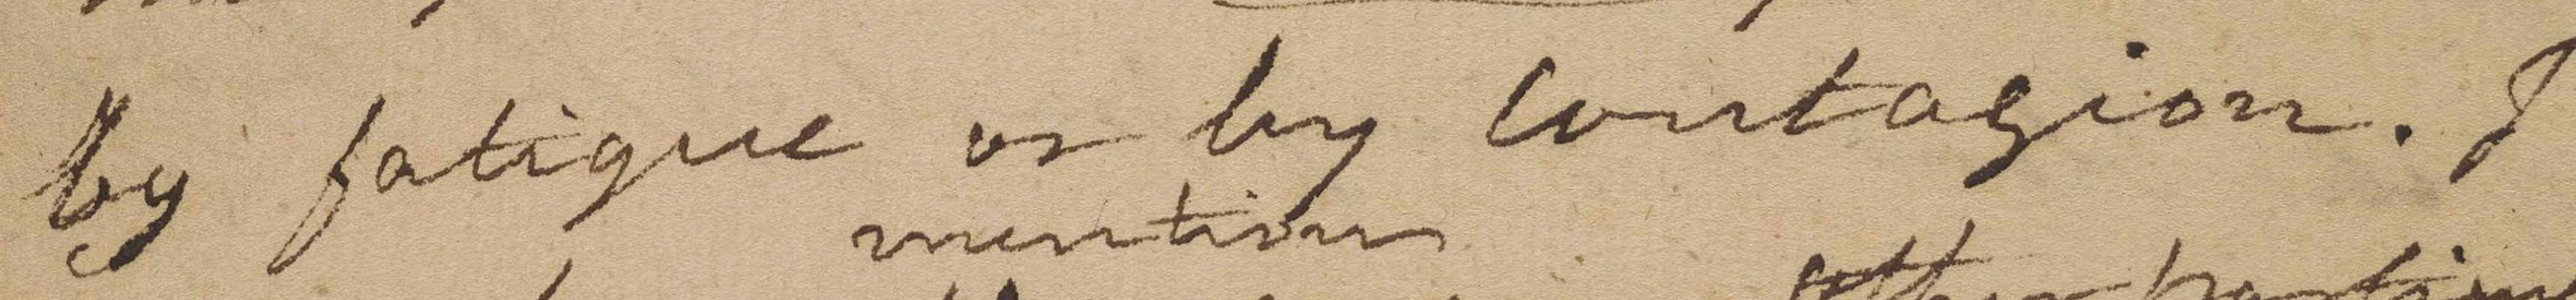by fatigue or by contagion. I
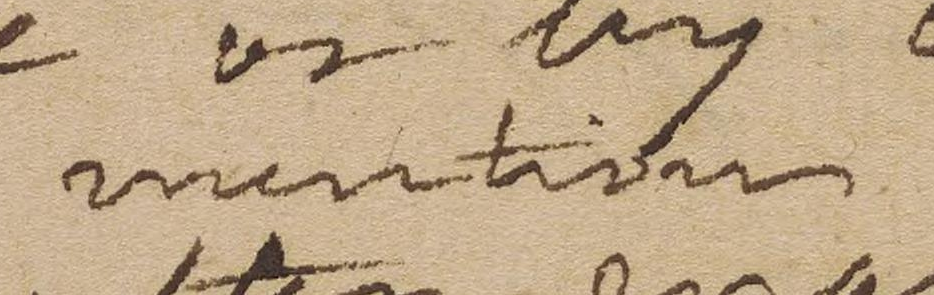mention
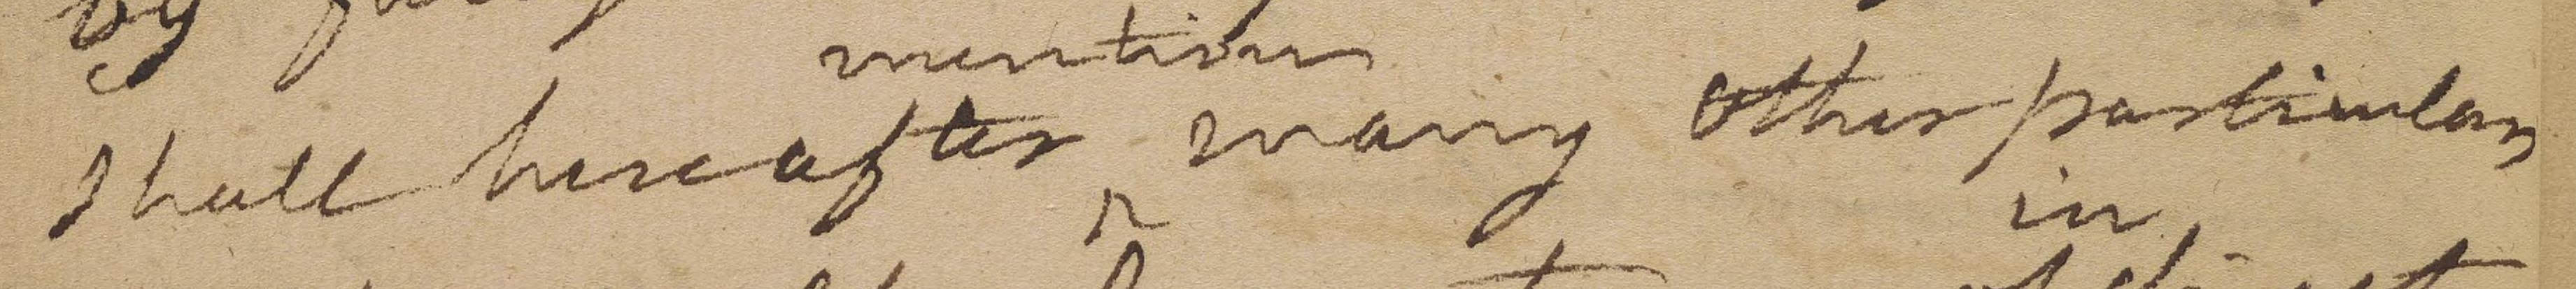shall hereafter ^ many other particulars
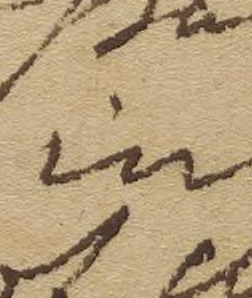in
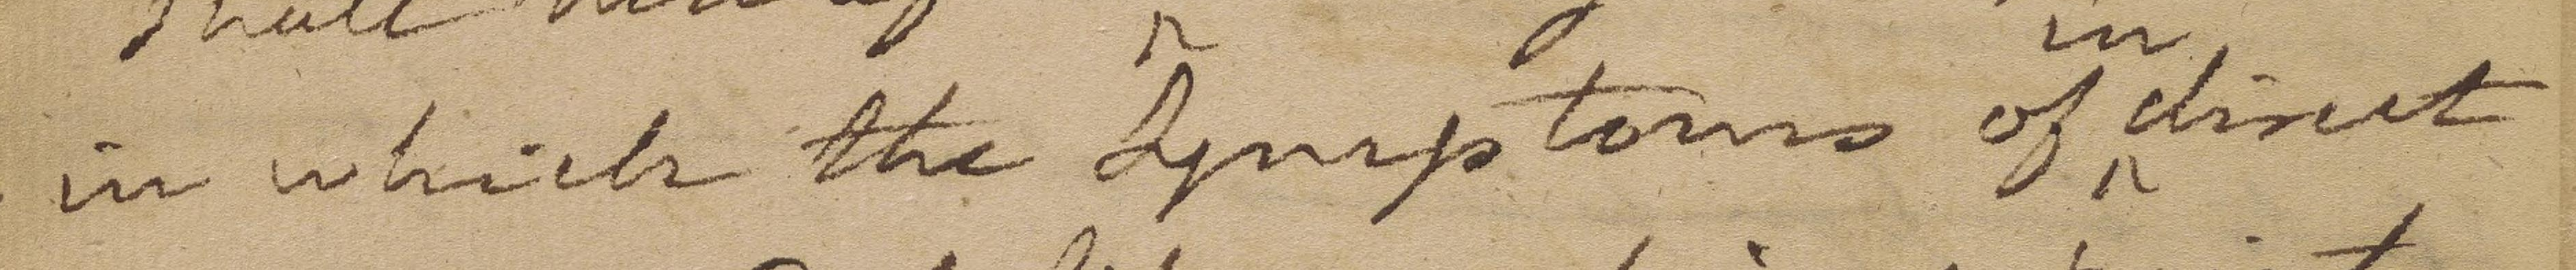in which the symptoms of ^ direct
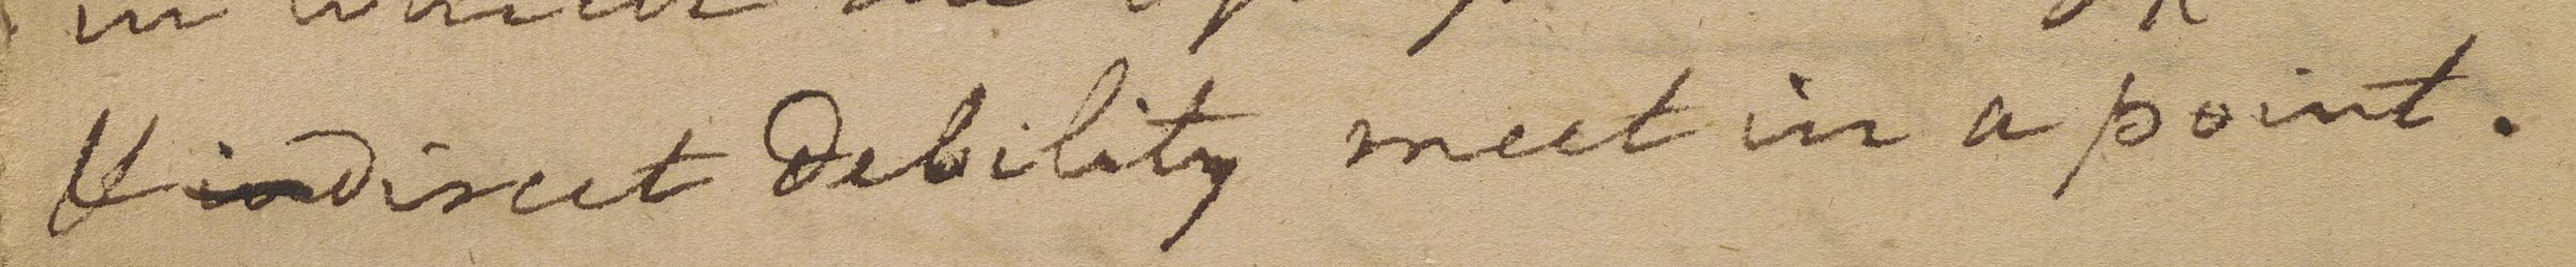& direct debility meet in a point.
